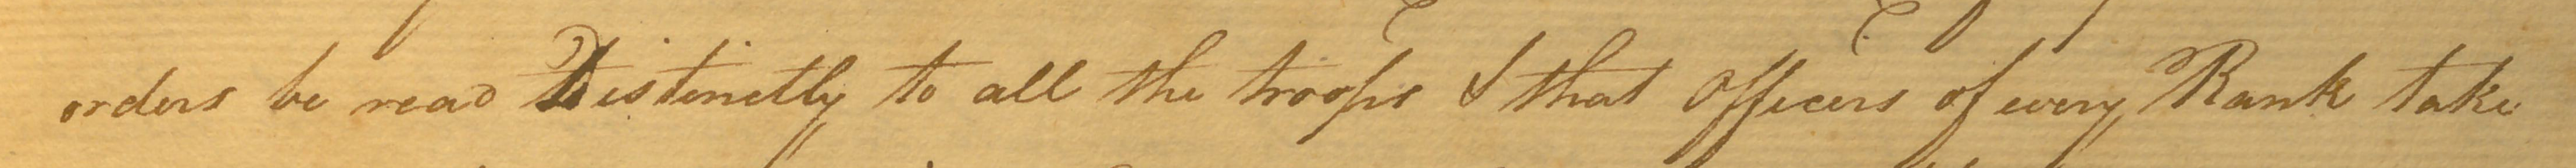orders be read Distinctly to all the troops & that officers of every Rank take
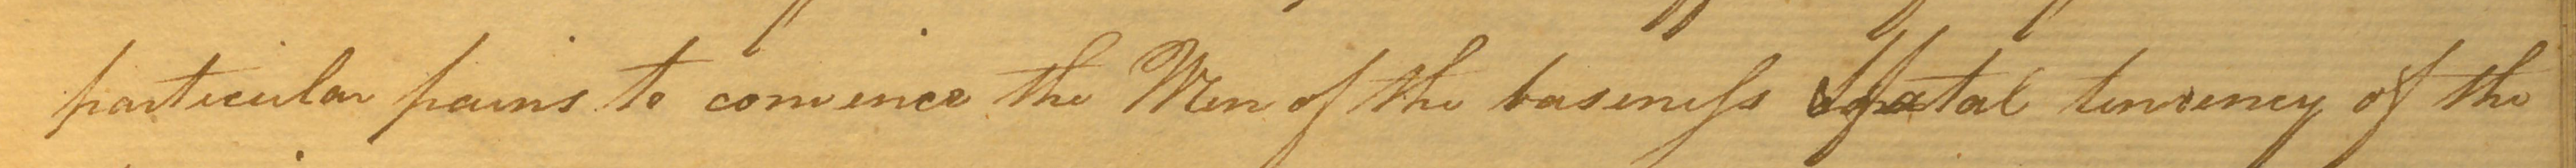particular pains to convince the Men of the baseness & fatal tendency of the
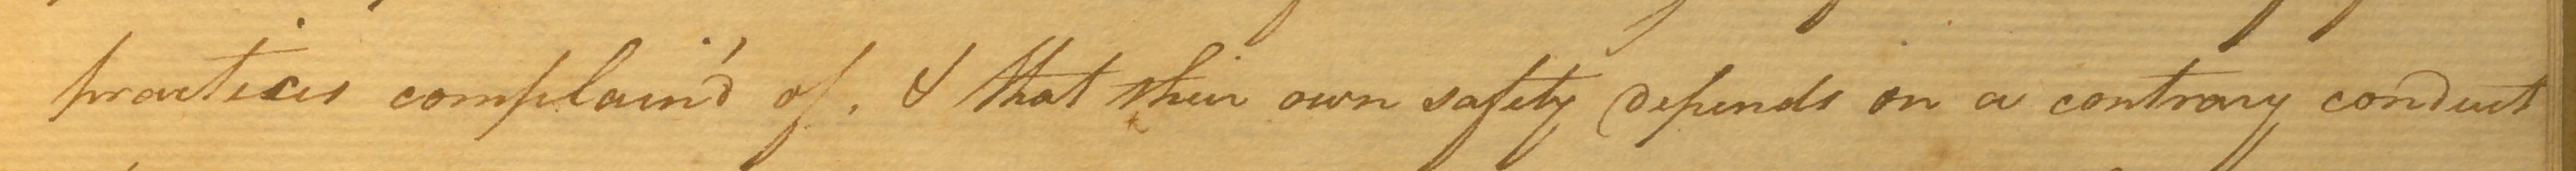practices complain'd of, & that their own safety depends on a contrary conduct
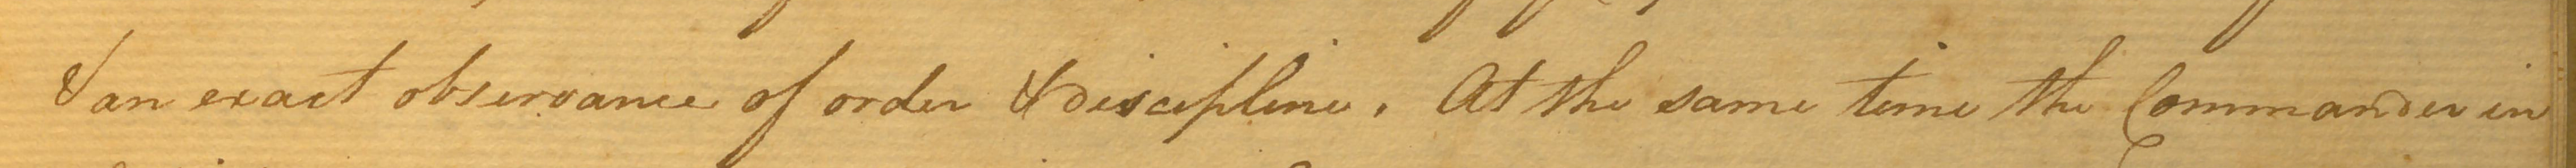& an exact observance of order & discipline. At the same time the Commander in
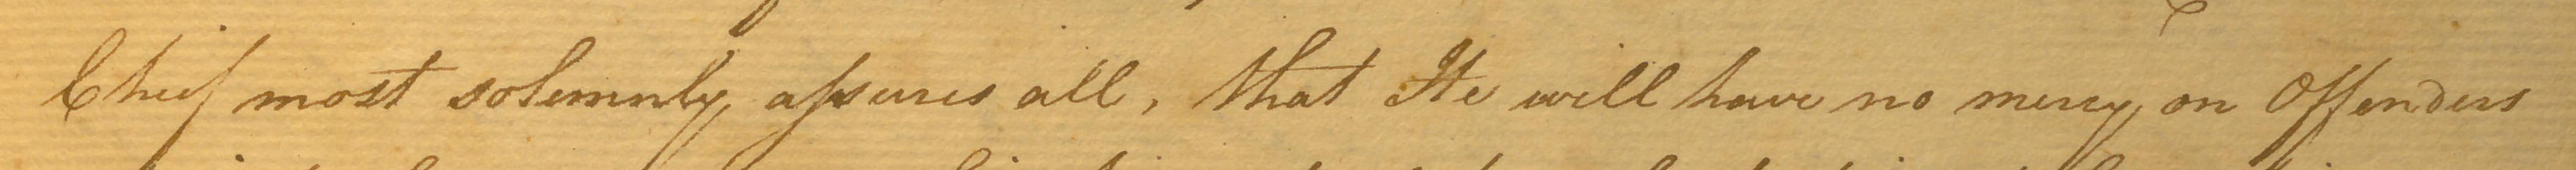Chief most solemnly assures all, that He will have no mercy on Offenders
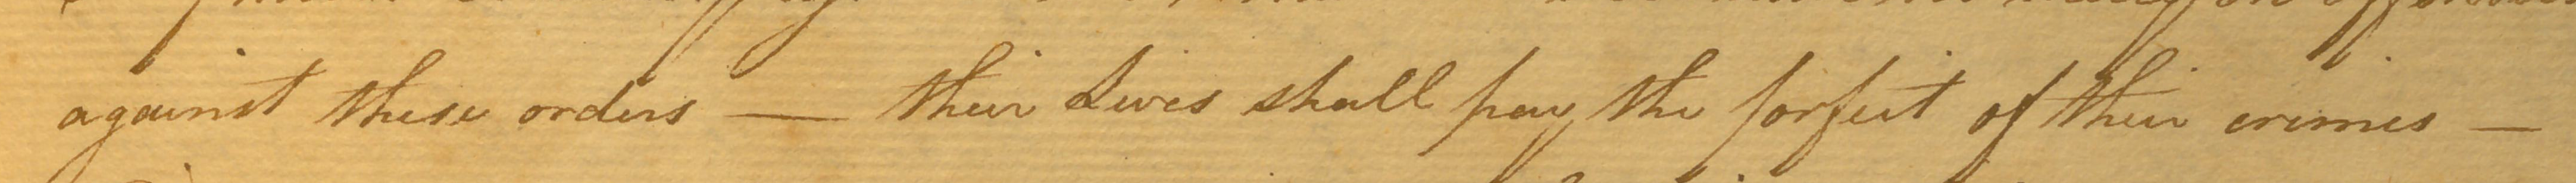against these orders- their Lives shall pay the forfeit of their crimes-
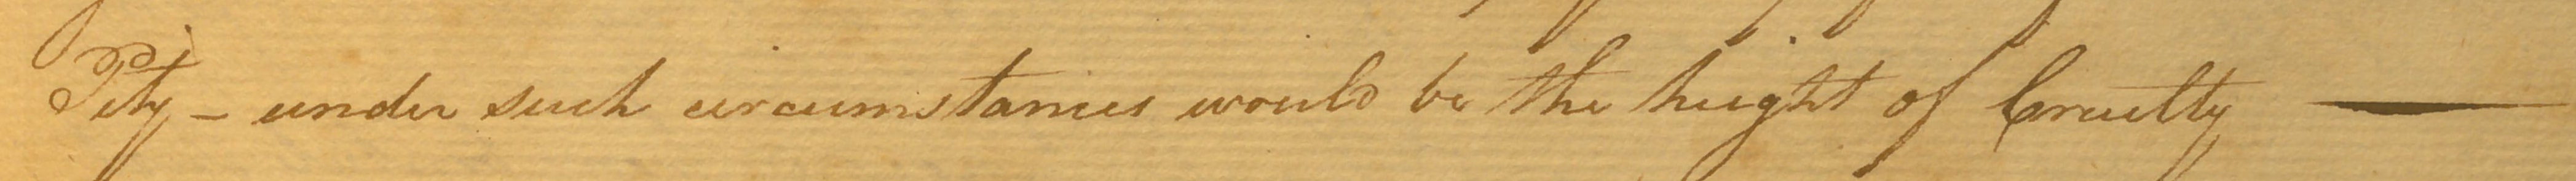Pity- under such circumstances would be the height of Cruelty-
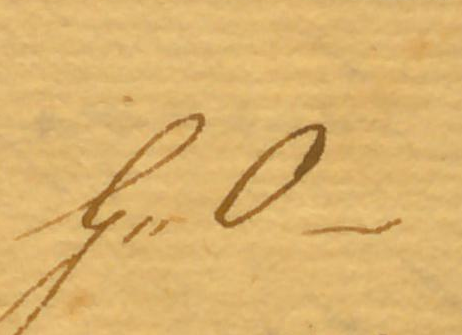G.O-
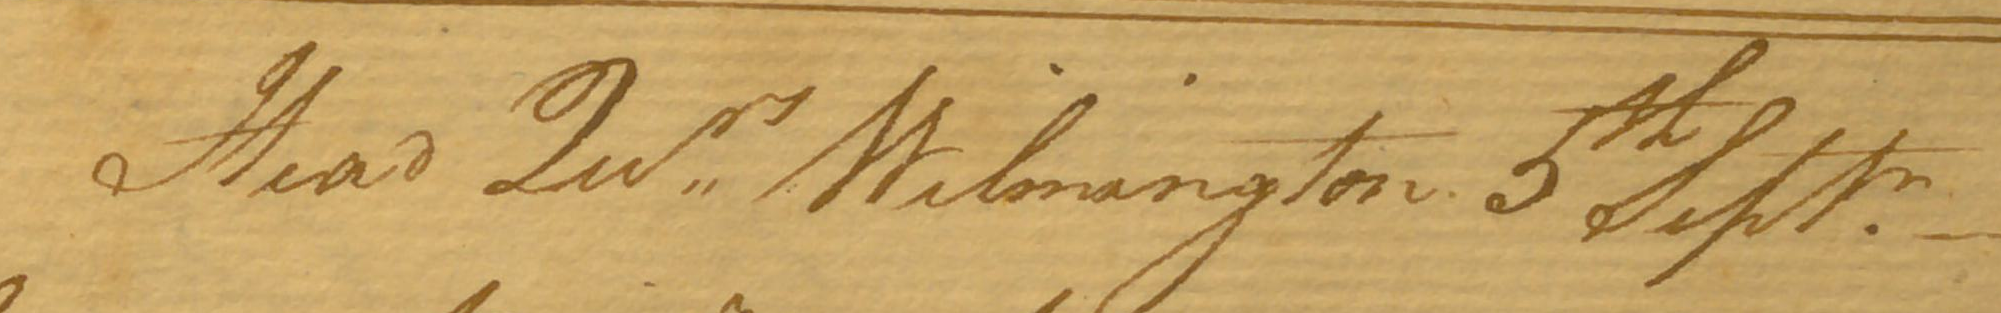Head Qu^rs. Wilmington 5^th Sept^r.-
